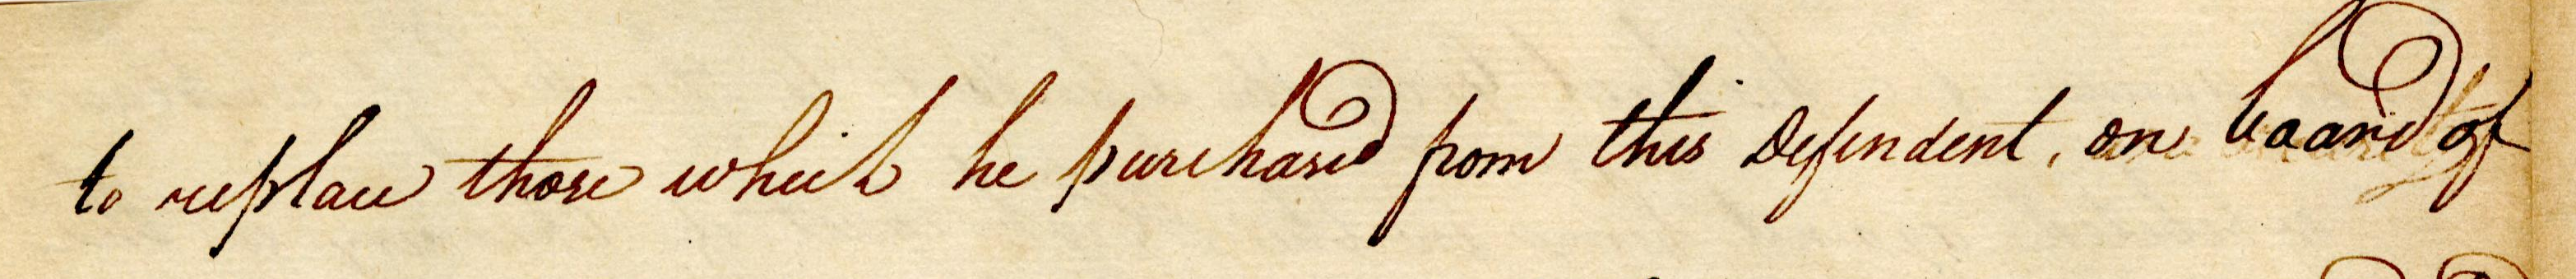to replace those which he purchased from this Defendant on board of
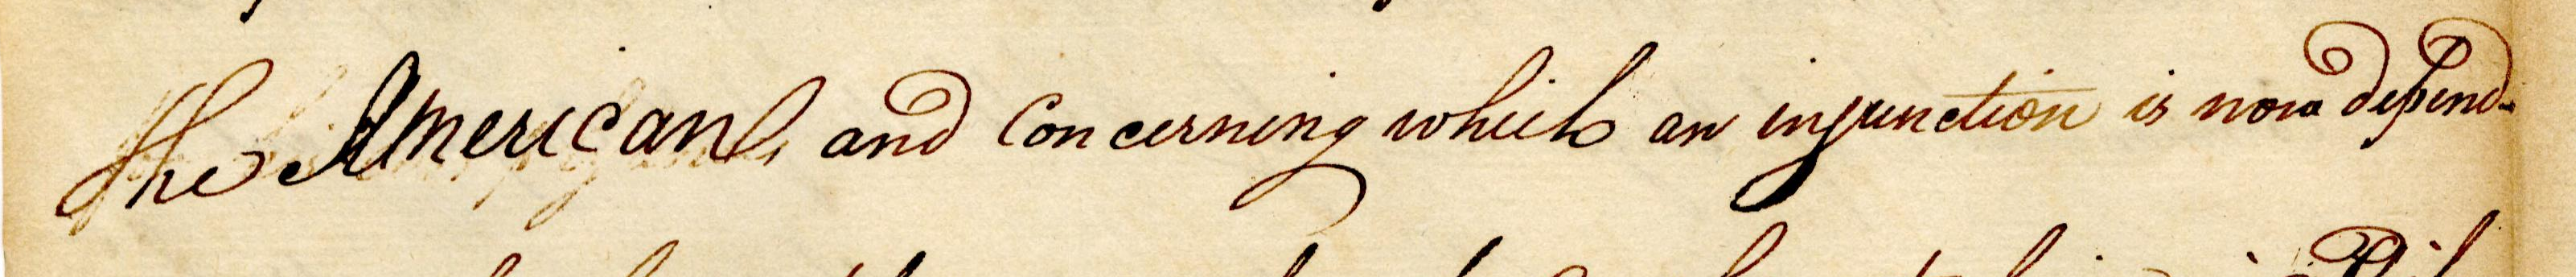the American, and concerning which an injunction is now depend-
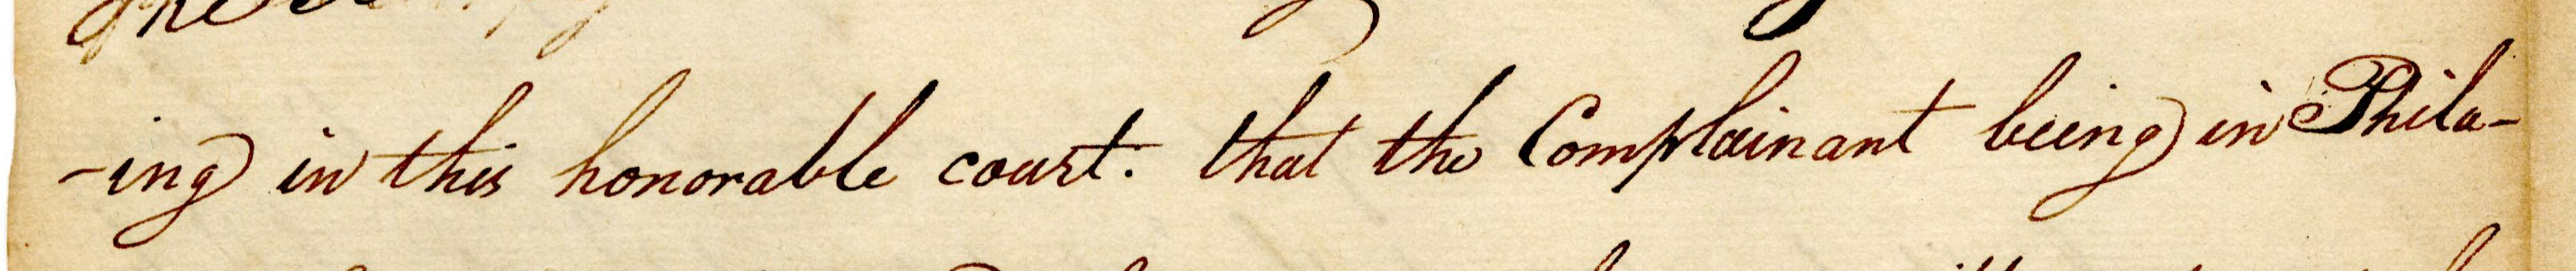-ing in this honorable court: that the Complainant being in Phila-
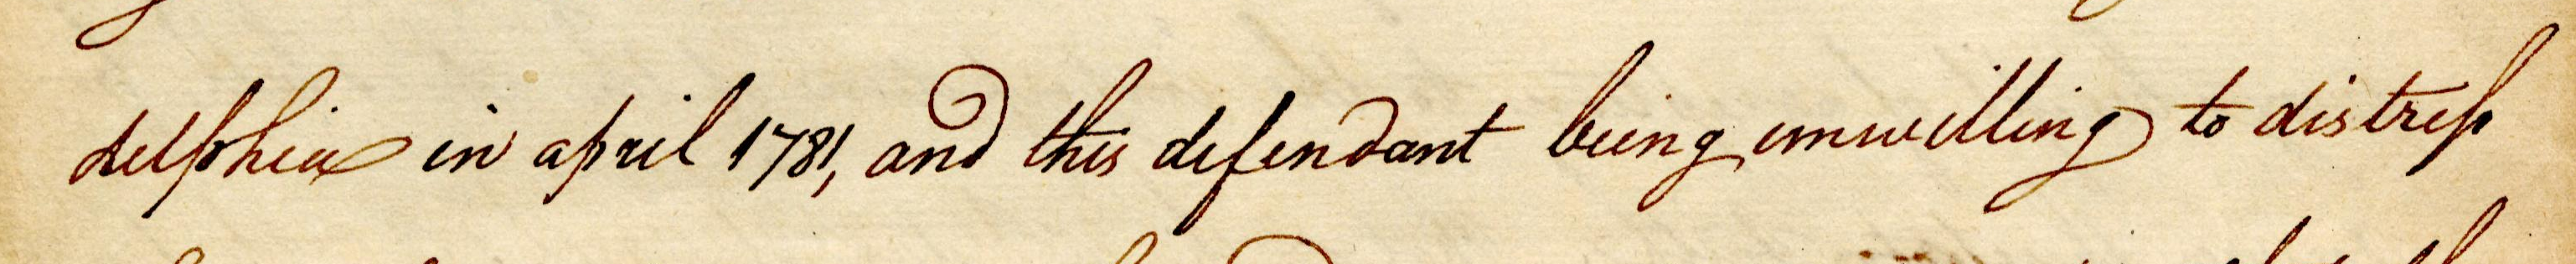-delphia in april 1781, and this defendant being unwilling to distress
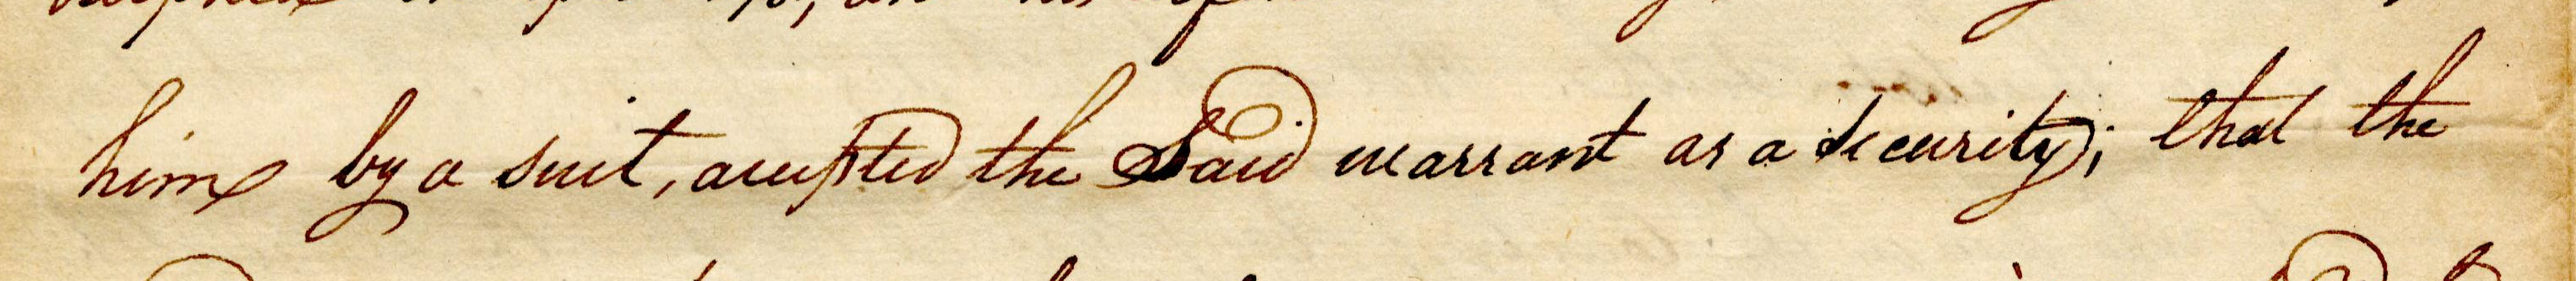him by a suit accepted the said warrant as a security; that the
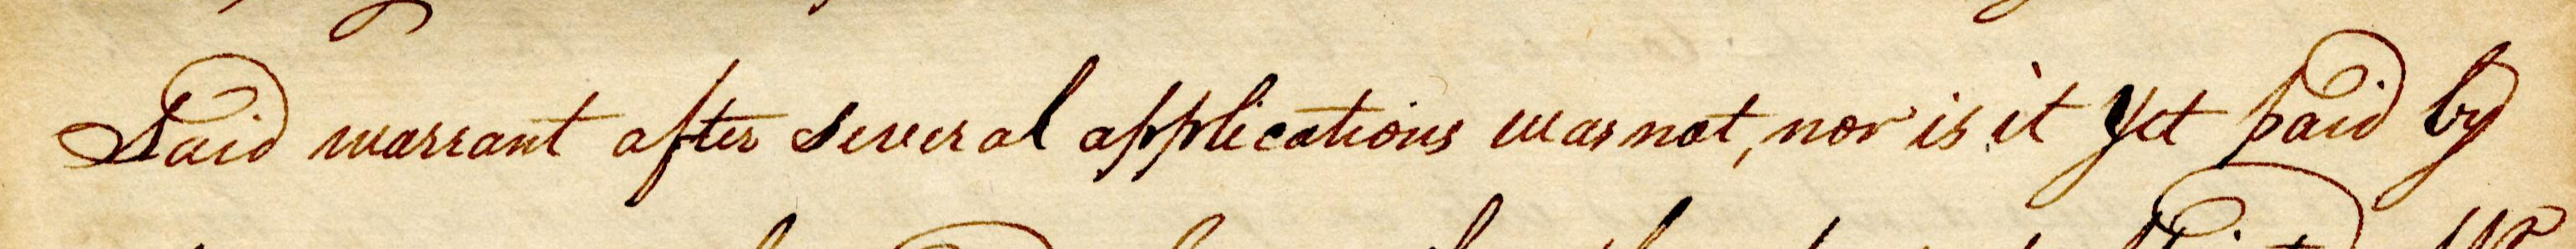Said warrant after several applications was not, nor is it yet paid by
